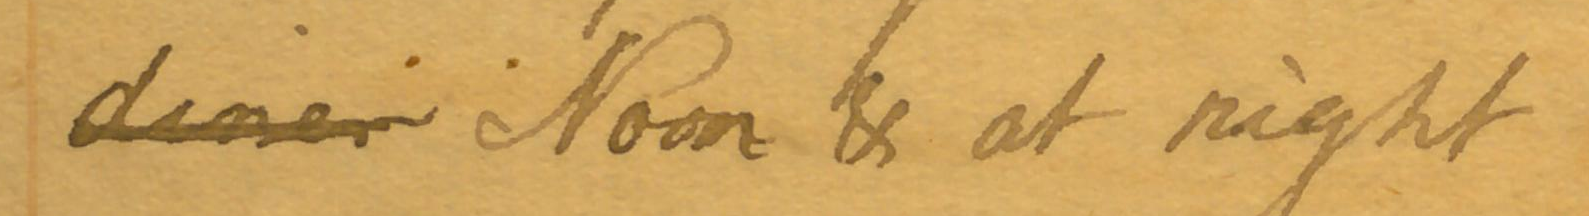[diner] Noon & at night
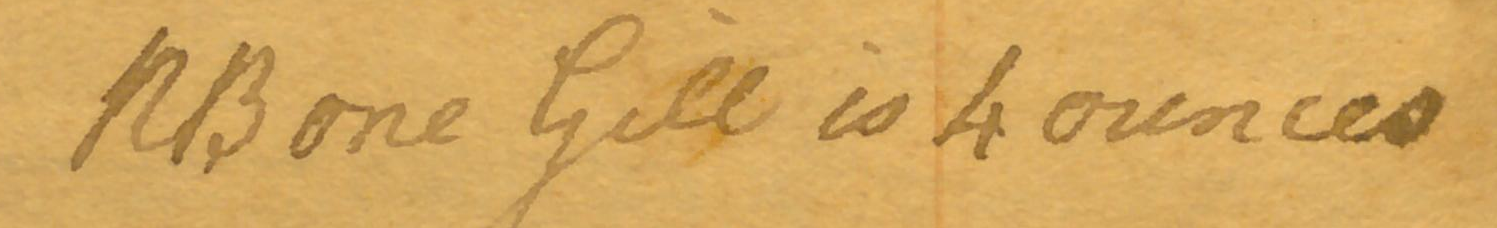NB one Gill is 4 ounces
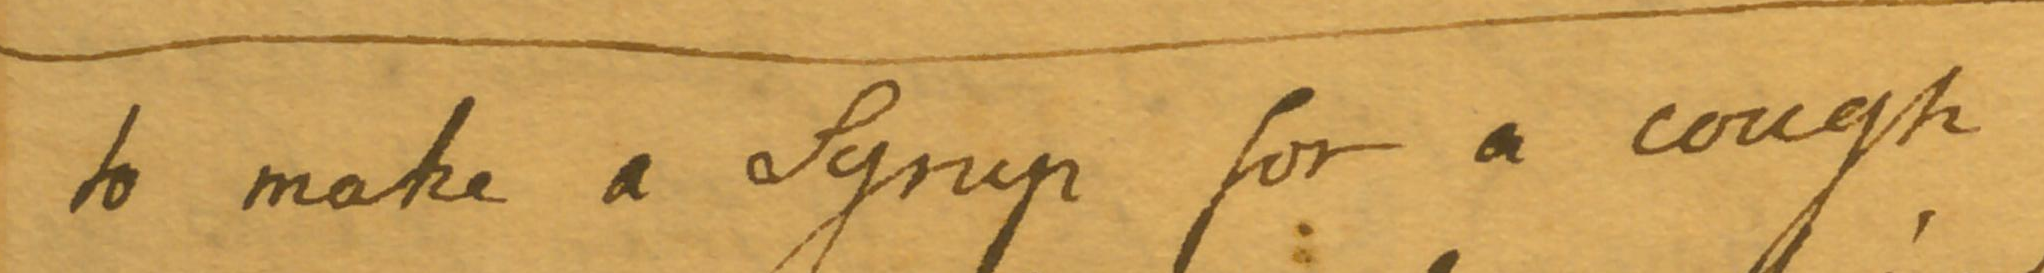to make a syrup for a cough
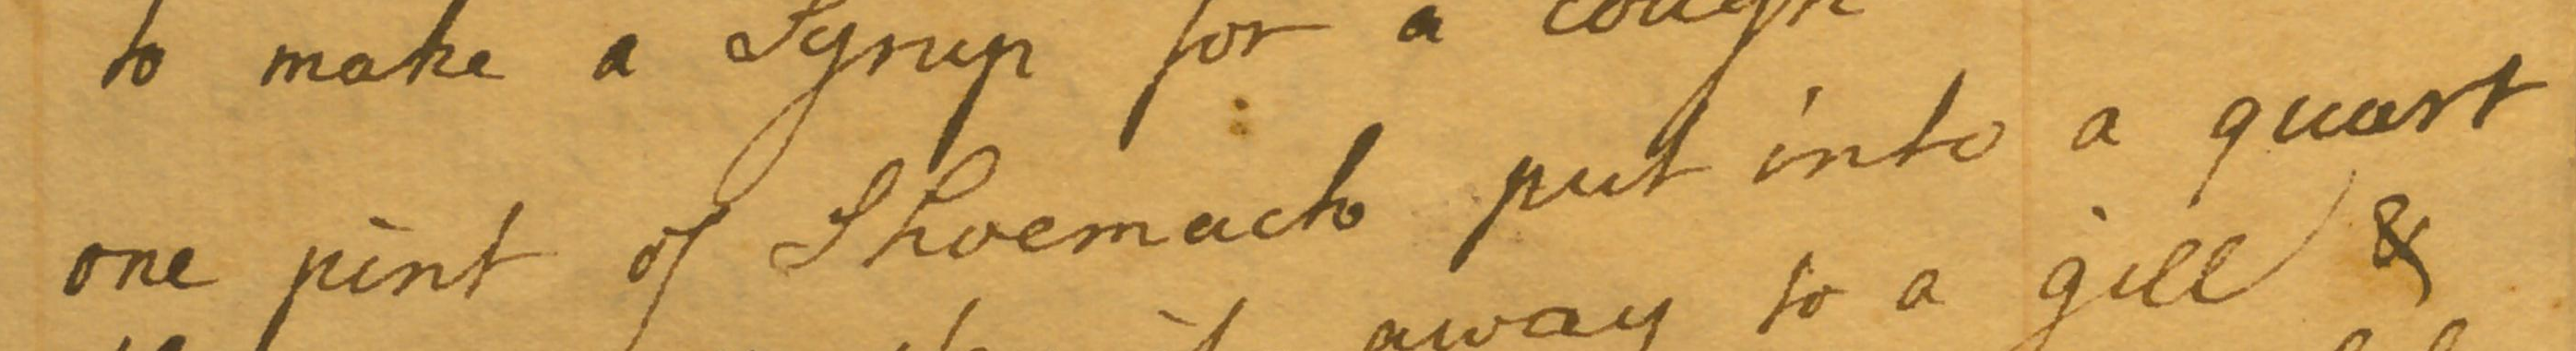one point of shoemach put into a quart
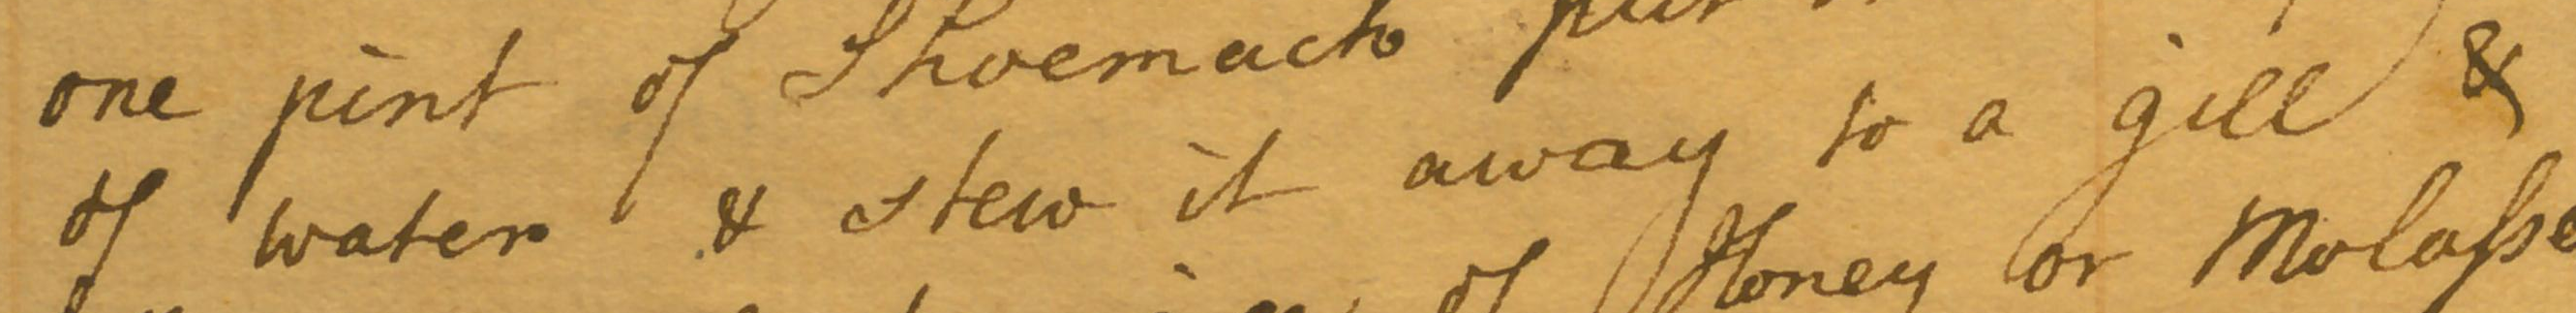of water & stew it away to a gill &
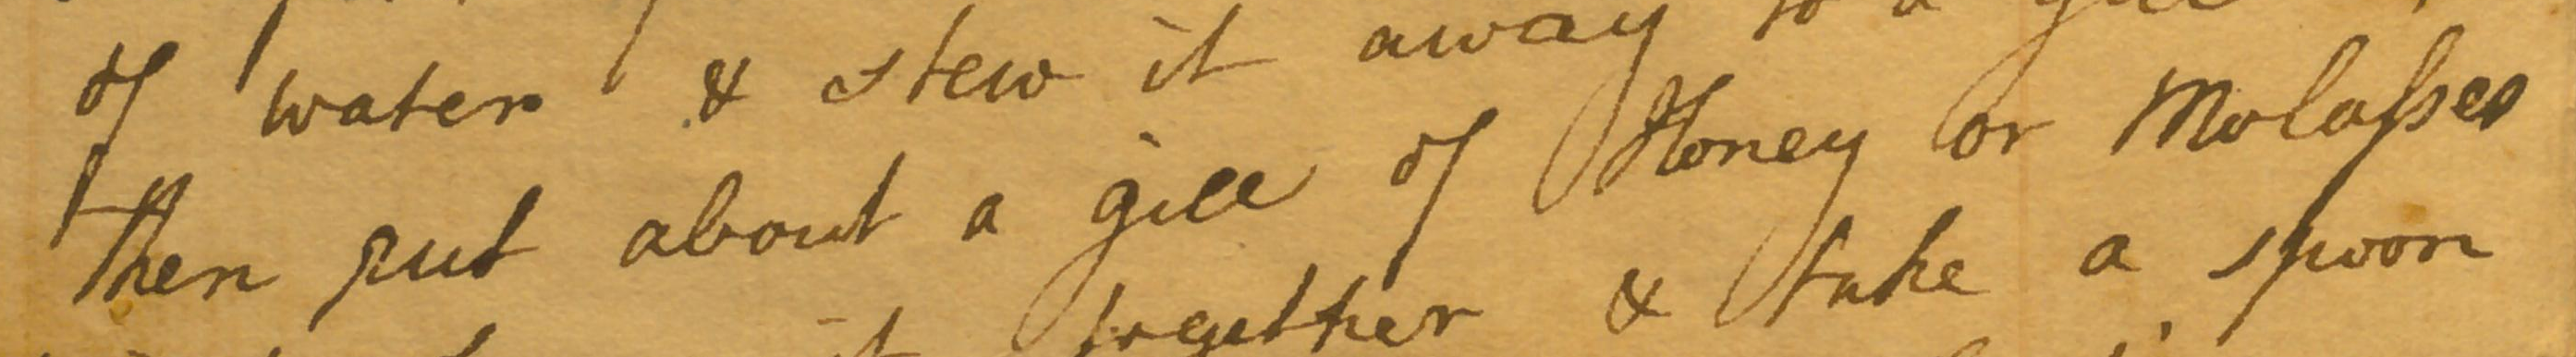then put about a gill of Honey or Molasses
